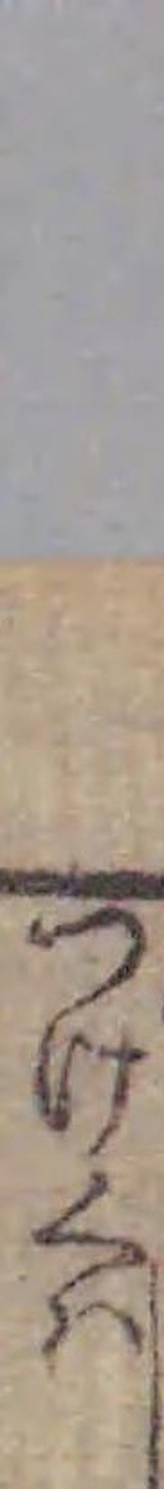つけくは
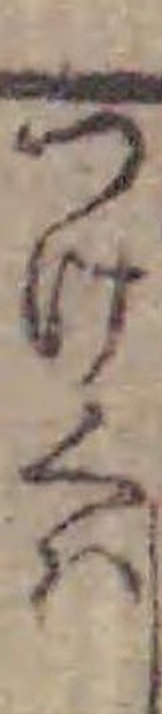つけくは
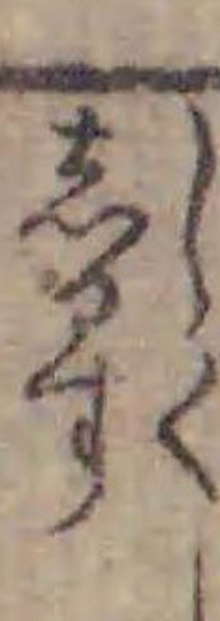しるす

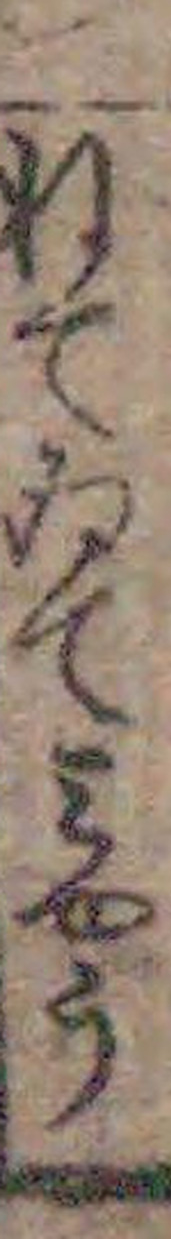ねてゐてみやう
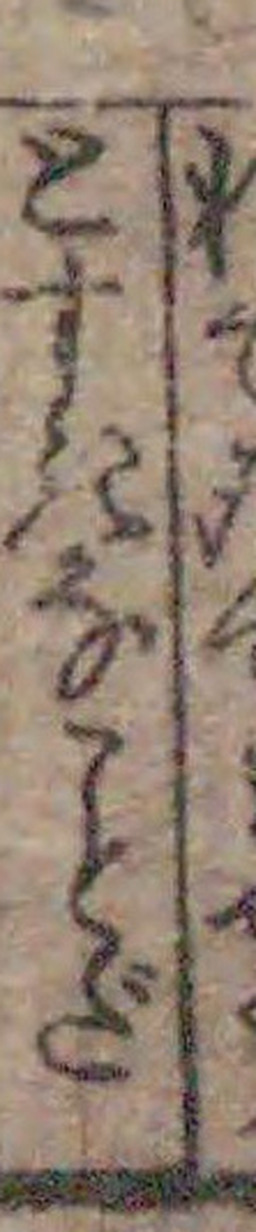とすきなことだ
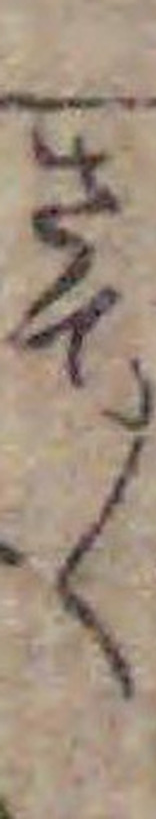さて〳〵
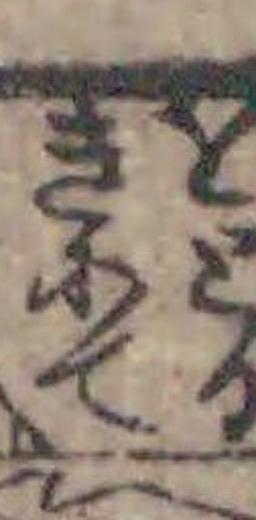きにて
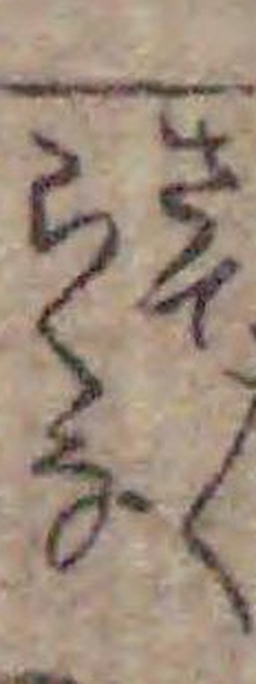らくな
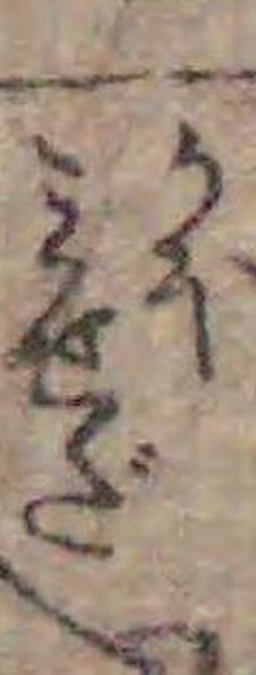みせだ
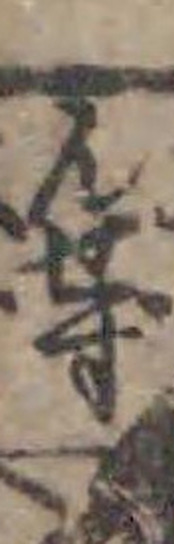んせず
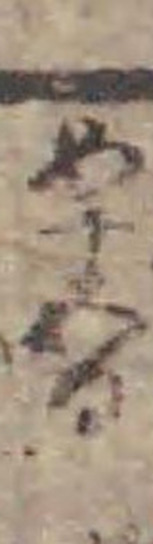め十五日
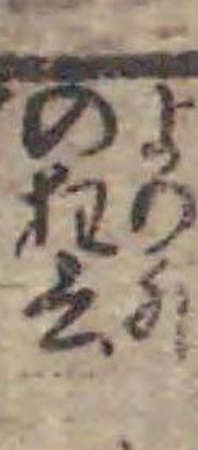の狂言
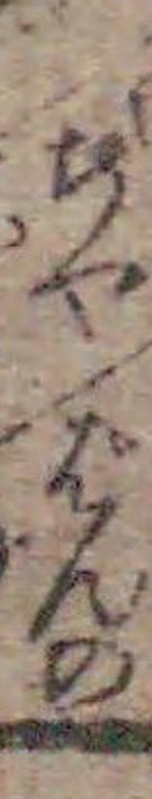ちやばんの
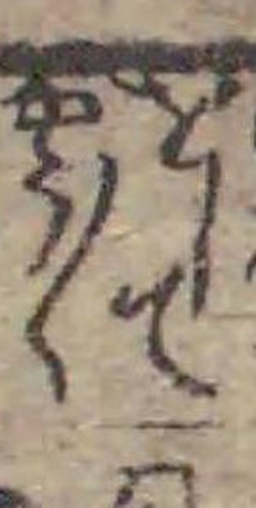やう〳〵
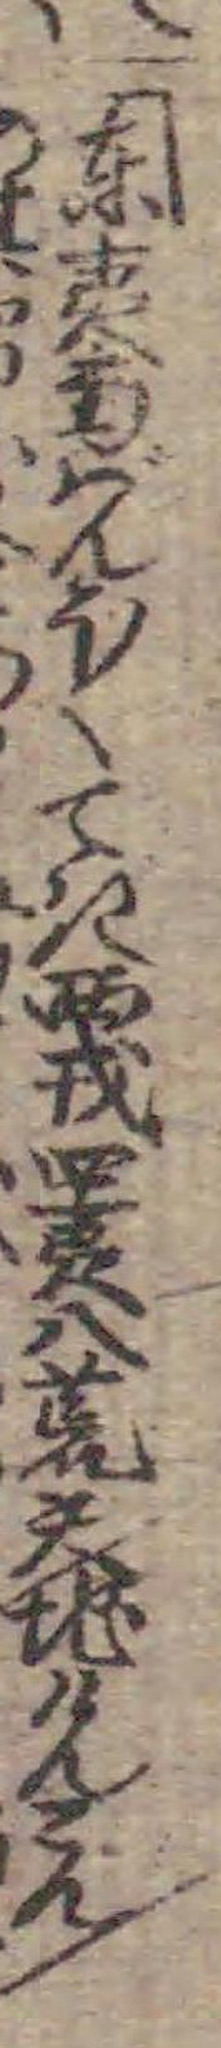〽東夷南ばんほくてき西戎四夷八荒天地けんこん
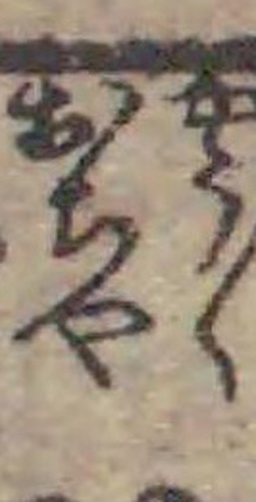おちや
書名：本樹真猿浮気噺 : 3巻
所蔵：国立国会図書館 National Diet Library, JAPAN
